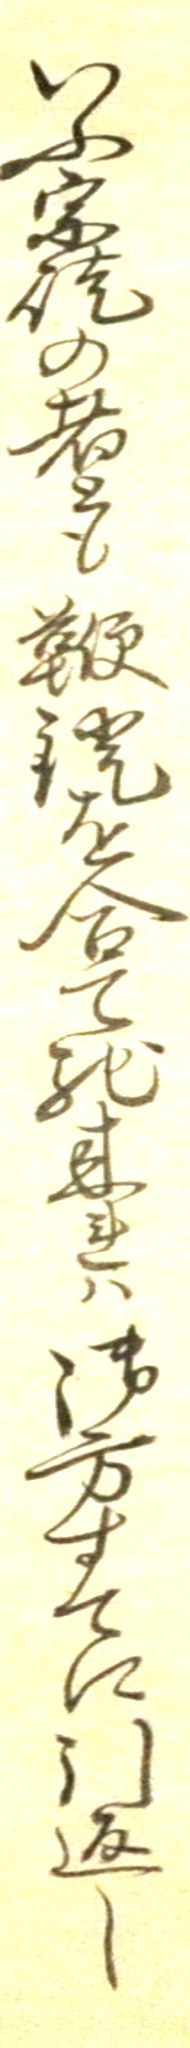いふ宗徒の者とも鞭鐙を合て馳来れは御方すてに引返し
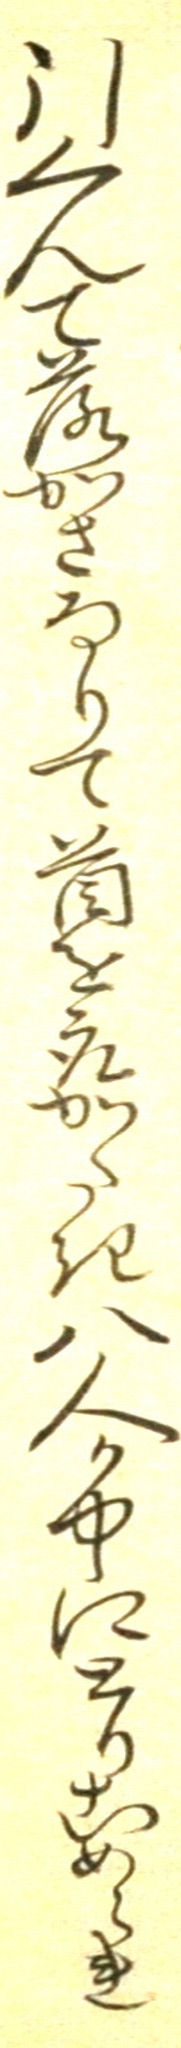引くんて落かさなりて首を取かたきは八人か中にとりこめられ
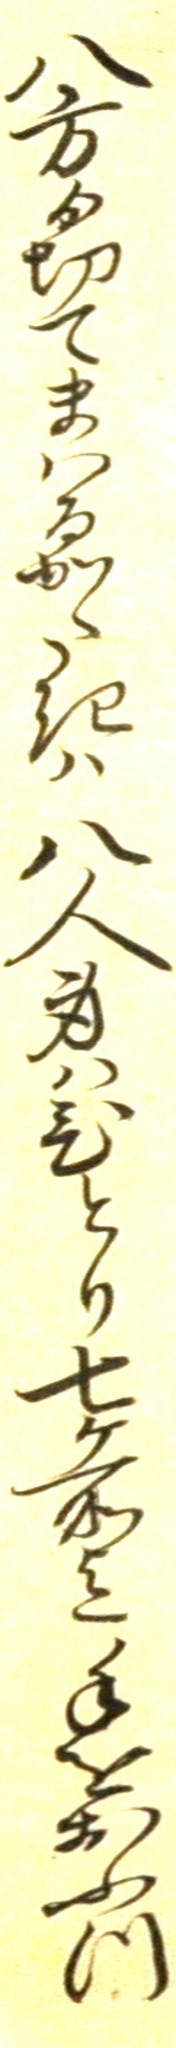八方より切てまはるかたきは八人身はひとり七ヶ所迄手をおふつ

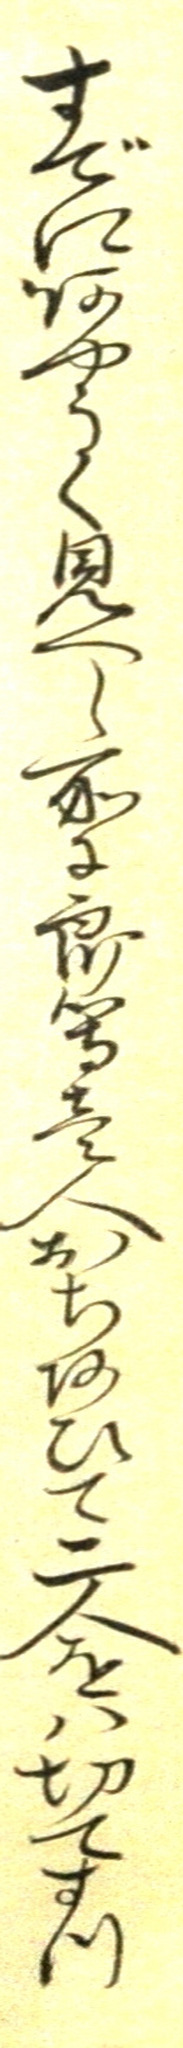すでにあやうく見へし所に郎等壱人おちあひて二人をは切てすつ
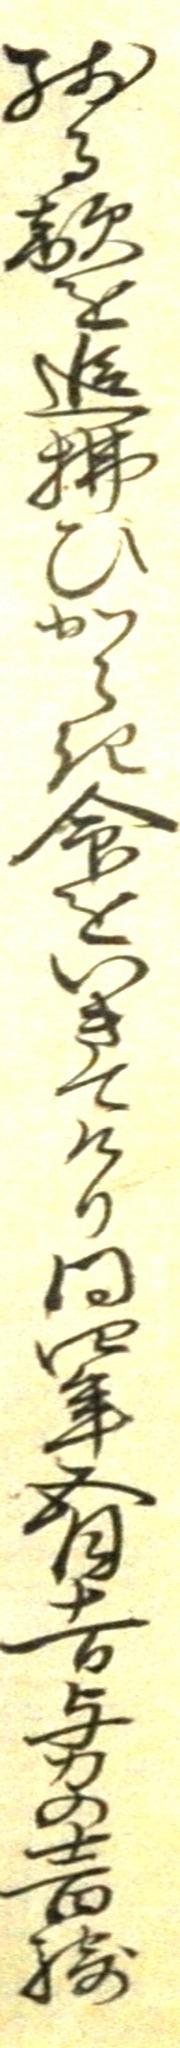残る敵を追払ひからき命をいきてけり同四年五月十一日与力の音崎
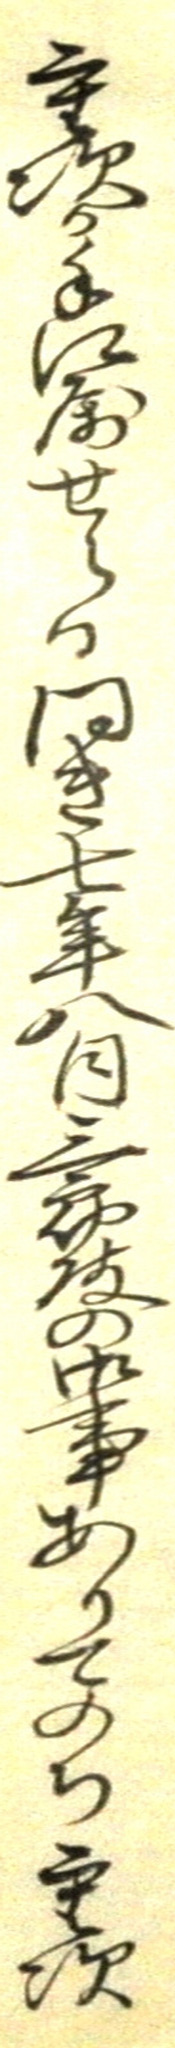重次か手に属せらる同き七年八月三郎殿の御事ありてのち重次
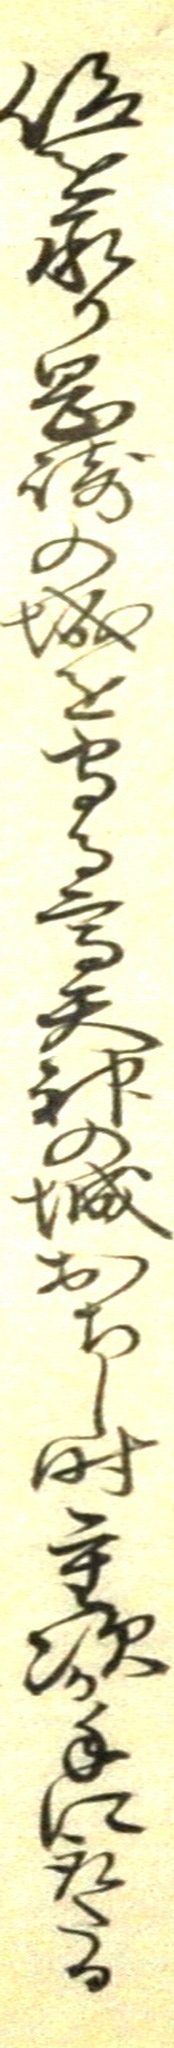仰を承り岡崎の城を守る高天神の城おちし時重次か手に取たる
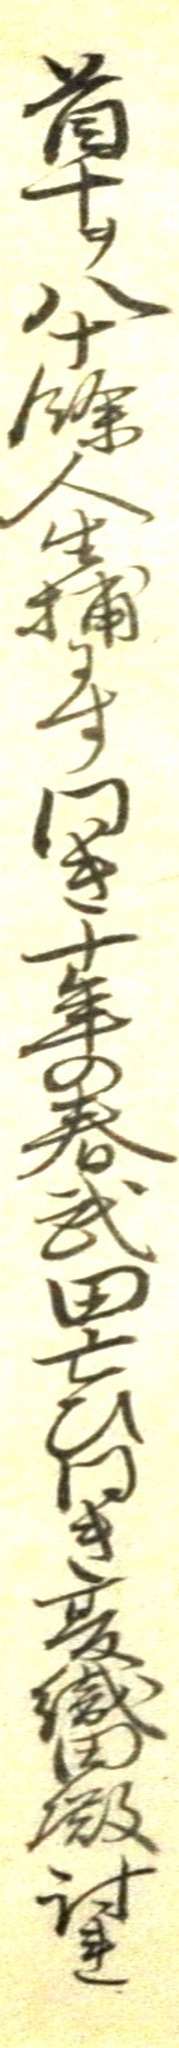首十ヲ八十余人生捕にす同き十年の春武田亡ひ同き夏織田殿討れ
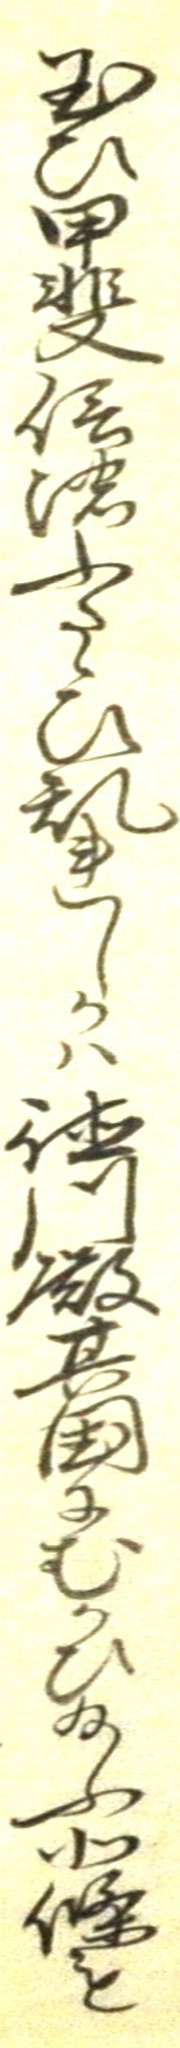玉ひ甲斐信濃ふたゝひ乱れしかは徳川殿其国にむかひ給ふ北条も
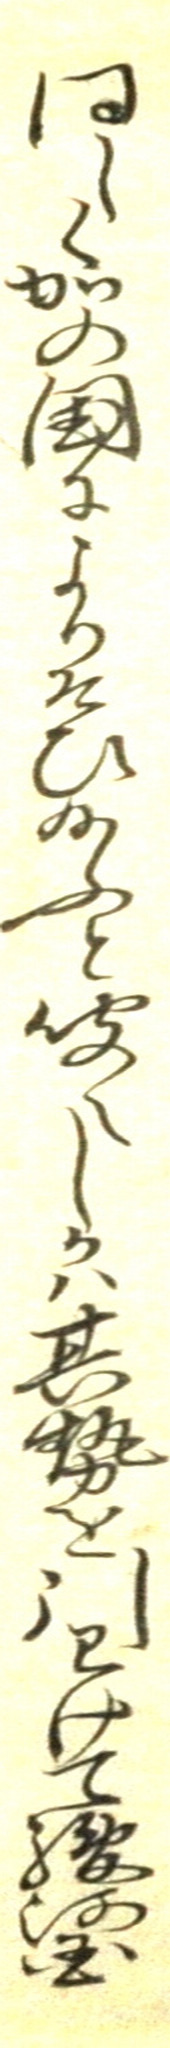同しくかの国によりそひ給ふと聞えしかは其勢を引わけて駿河国
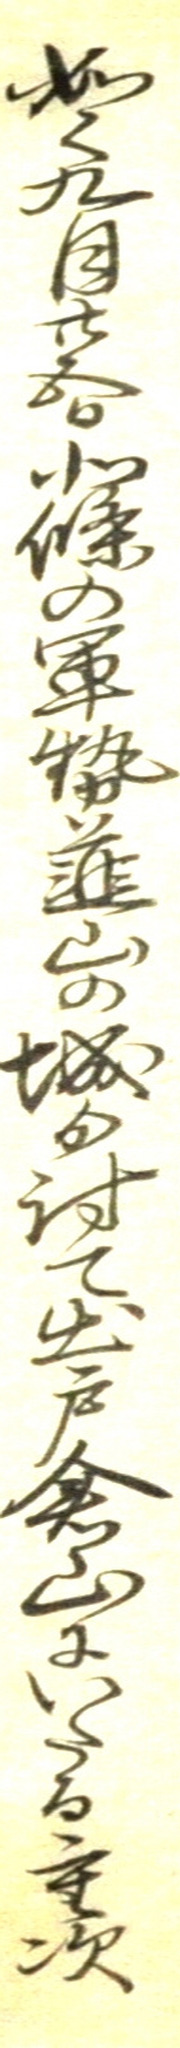如く九月廿五日北条の軍勢韮山の城より討て出戸倉山にいたる重次
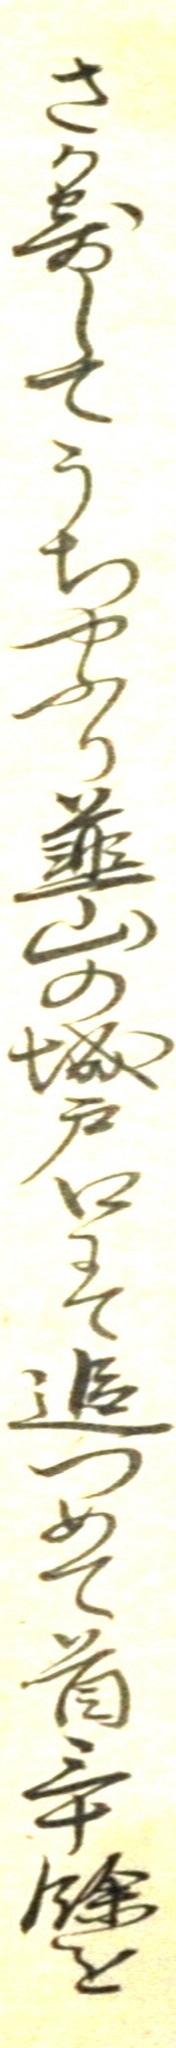さか寄してうちやふり韮山の城戸口にて追つめて首三十余を
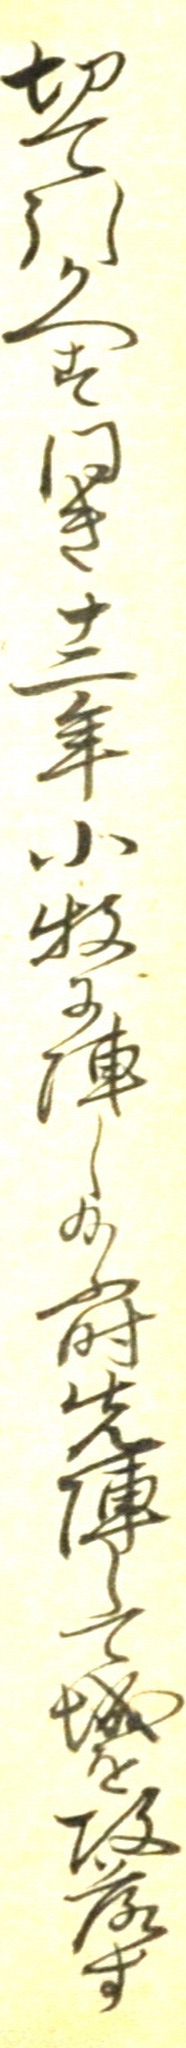切て引かへす同き十二年小牧に陣し給ふ時先陣して城を攻落す
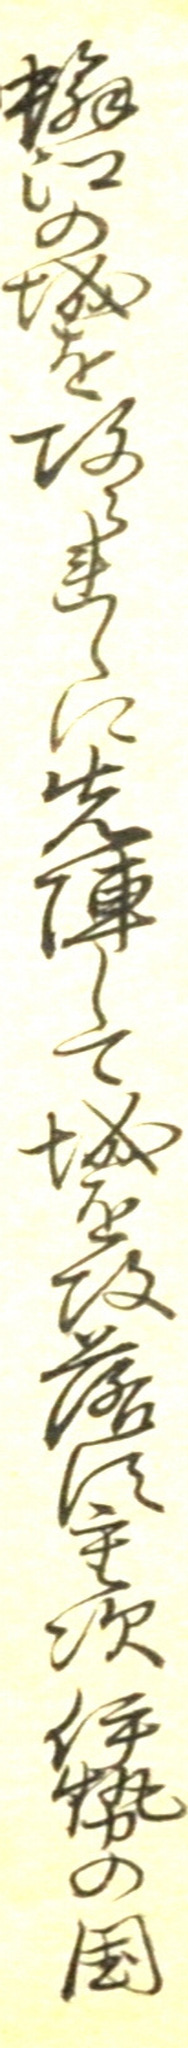蟹江の城を攻られしに先陣して城を攻落す重次伊勢の国
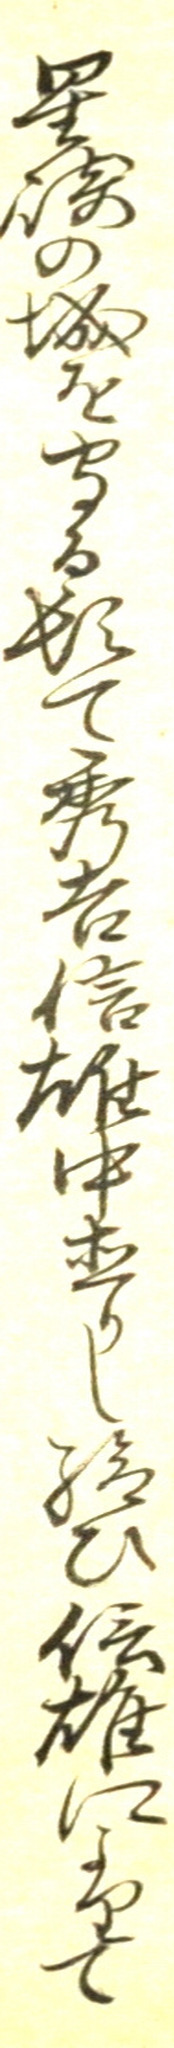星崎の城を守る頓て秀吉信雄中直りし給ひ信雄によりて
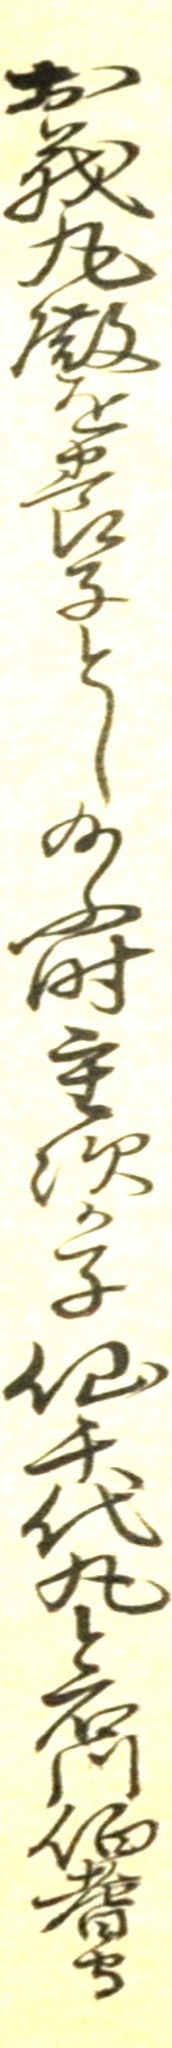お義丸殿を養子とし給ふ時重次か子仙千代丸と石川伯耆守
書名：藩翰譜（四・上）
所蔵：伊那市立高遠町図書館・合同会社AMANE
